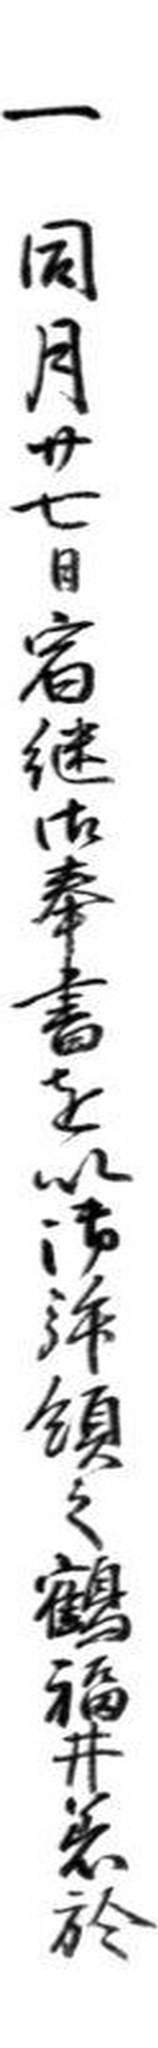一同月廿七日宿継御奉書を以御拝領之鶴福井着於
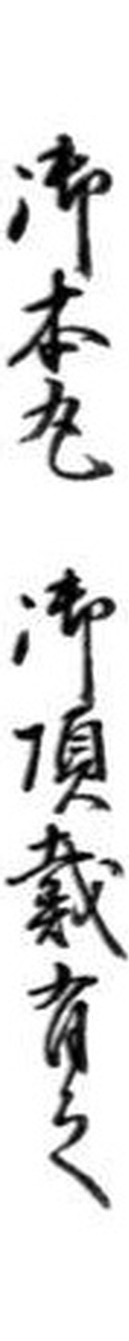御本丸御頂戴有之
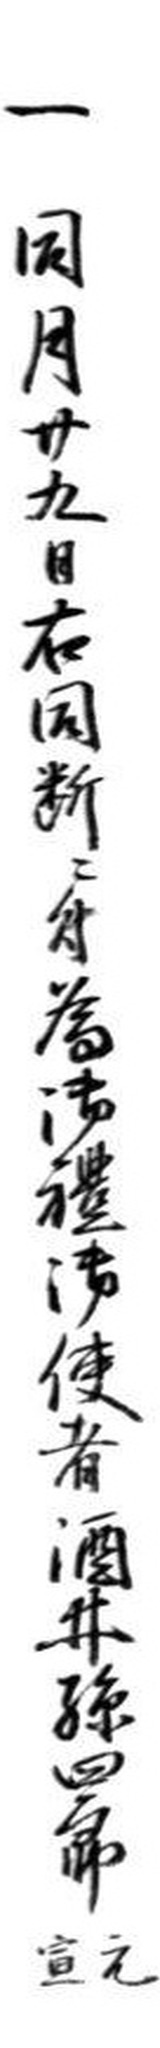一同月廿九日右同断ニ付為御礼御使者酒井孫四郎元宣
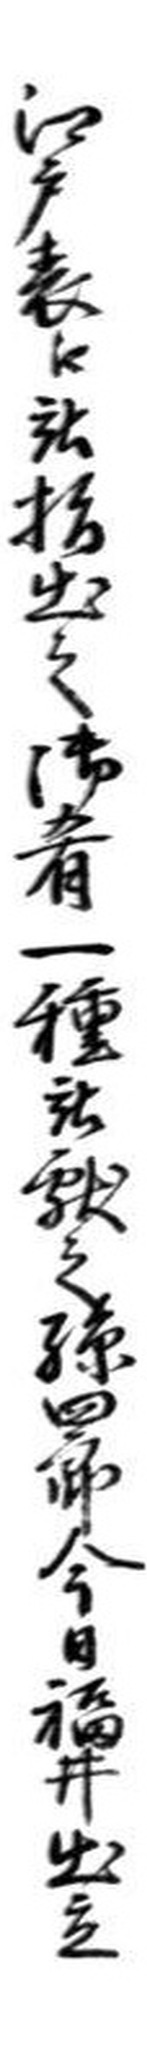江戸表江被指出之御肴一種被献之孫四郎今日福井出立
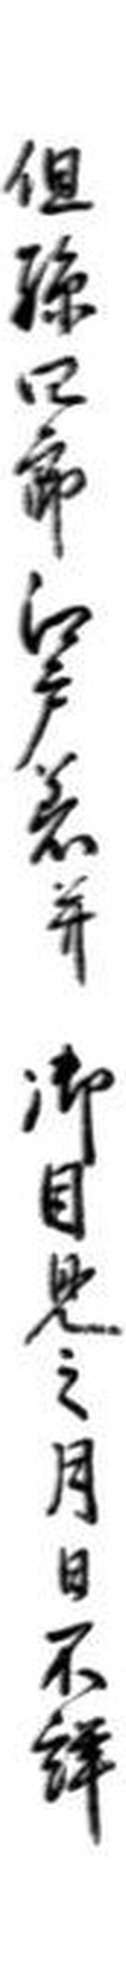但孫四郎江戸着幷御目見之月日不詳
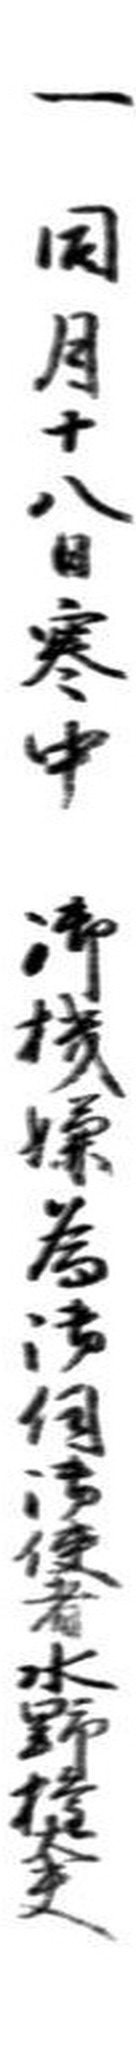一同月十八日寒中御機嫌為御伺御使者水野権大夫
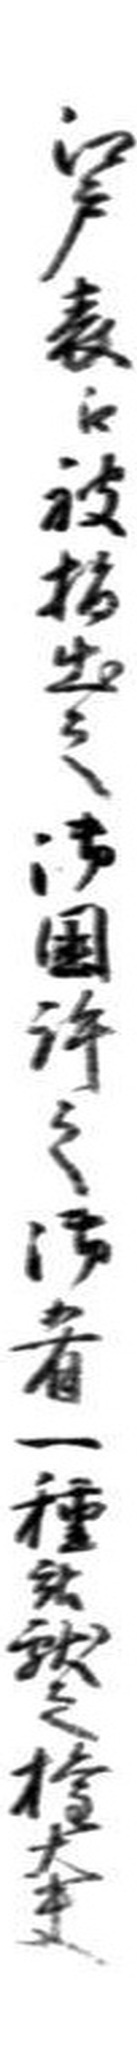江戸表江被指出之御国許之御肴一種被献之権大夫
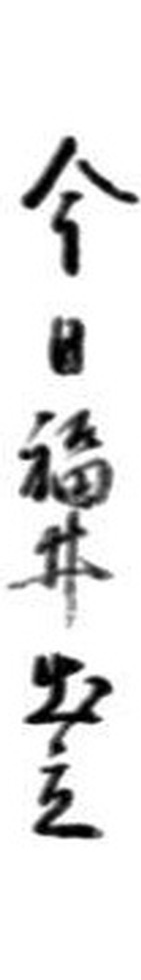今日福井出立
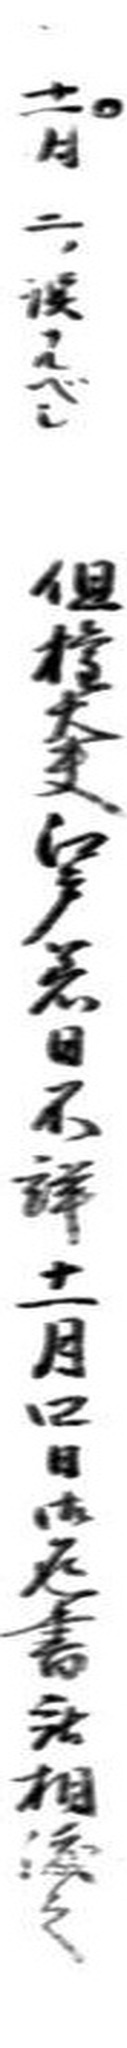十一月二ノ誤タルベシ但権大夫江戸着日不詳十一月四日御返書被相渡之
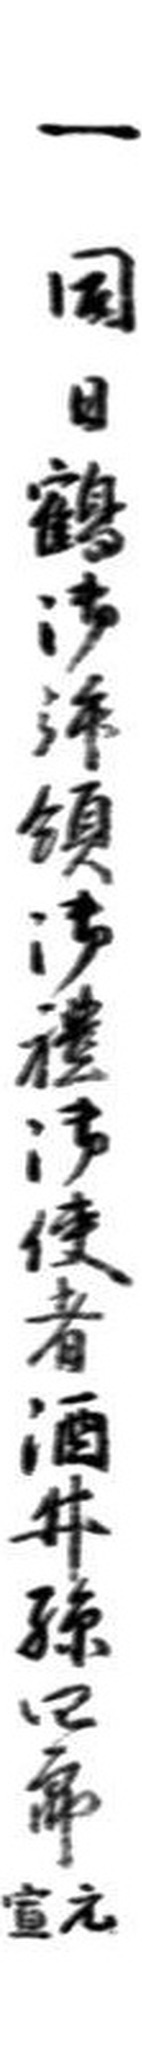一同日鶴御拝領御礼御使者酒井孫四郎元宣

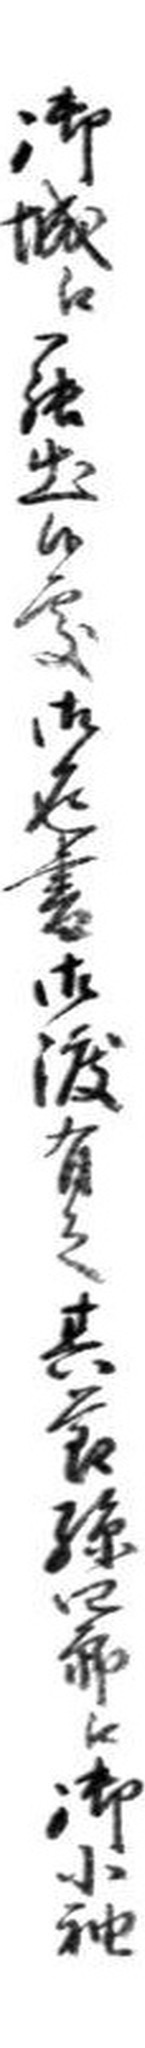御城江罷出候処御返書御渡有之其節孫四郎江御小袖
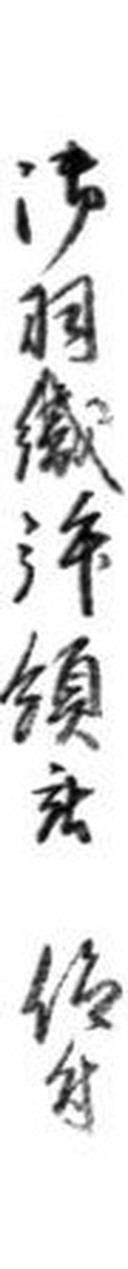御羽織拝領被仰付
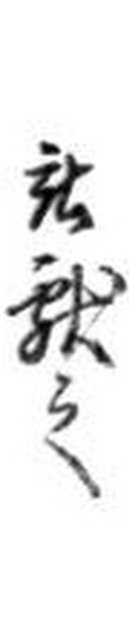被献之
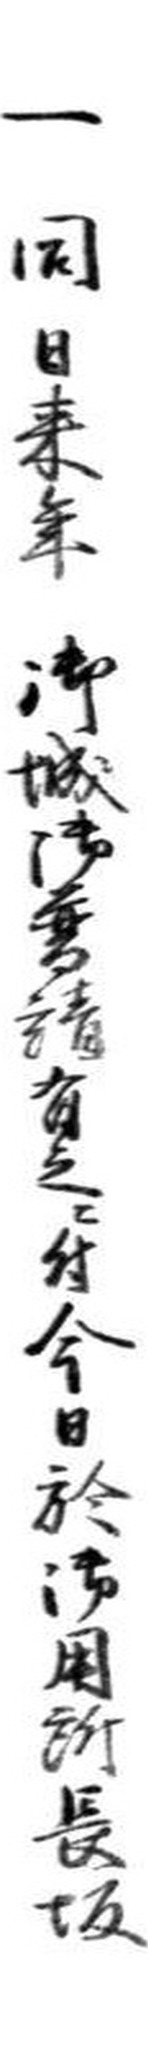一同日来年御城御普請有之ニ付今日於御用所長坂
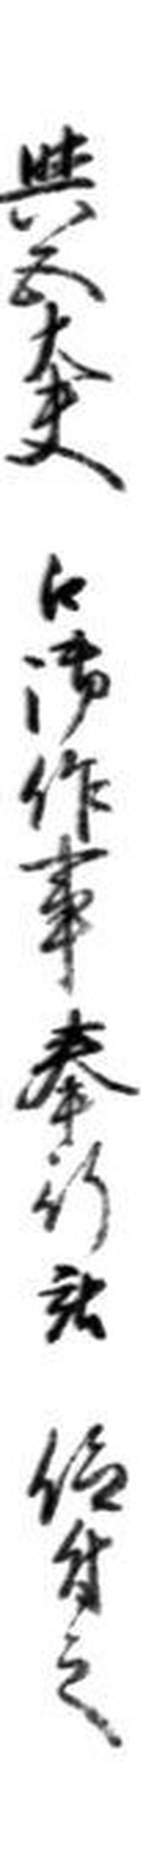与五大夫江御作事奉行被仰付之
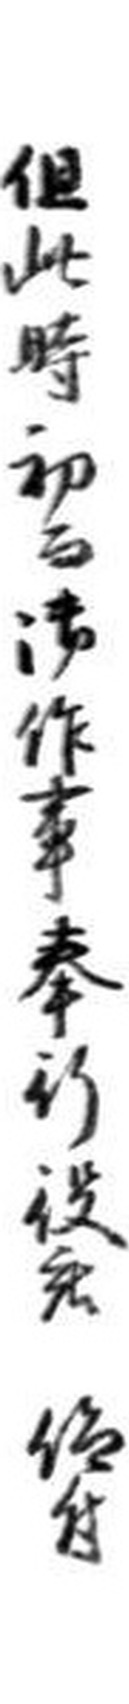但此時初而御作事奉行役被仰付
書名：家譜 七 光通公 従寛文四年到同九年
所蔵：福井県文書館 Fukui Prefectural Archives
